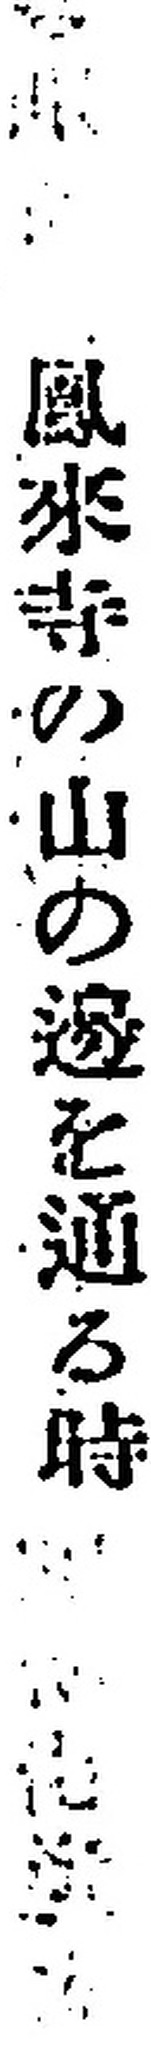鳳来寺の山の辺を通る時
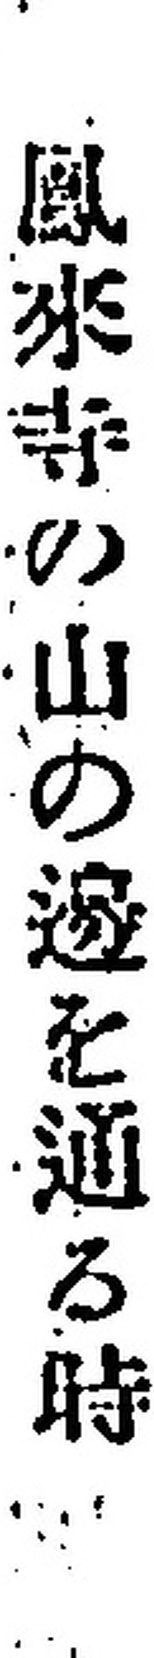鳳来寺の山の辺を通る時
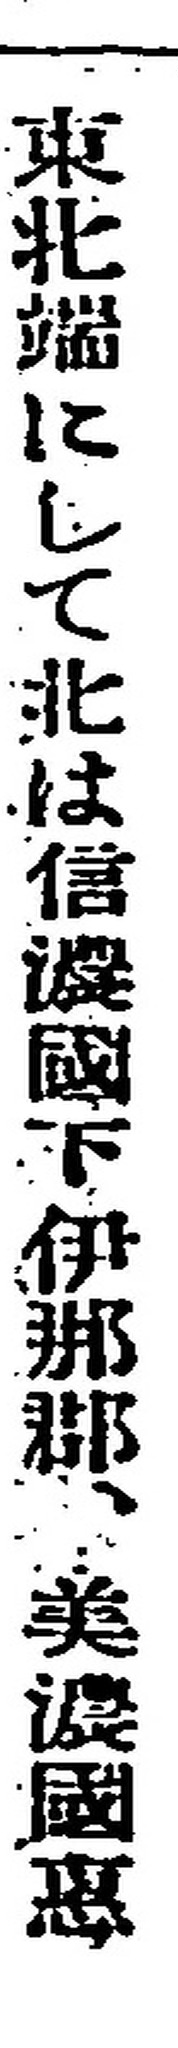東北端にして北は信濃国下伊那郡、美濃国恵
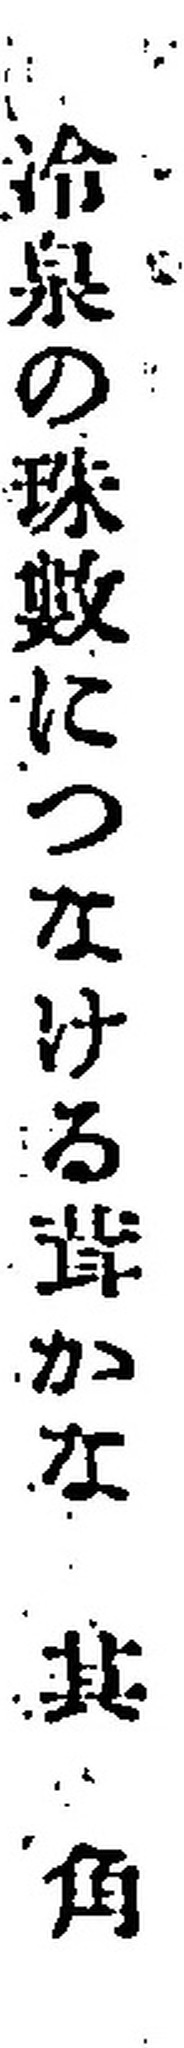冷泉の珠数につなける茸かな其角
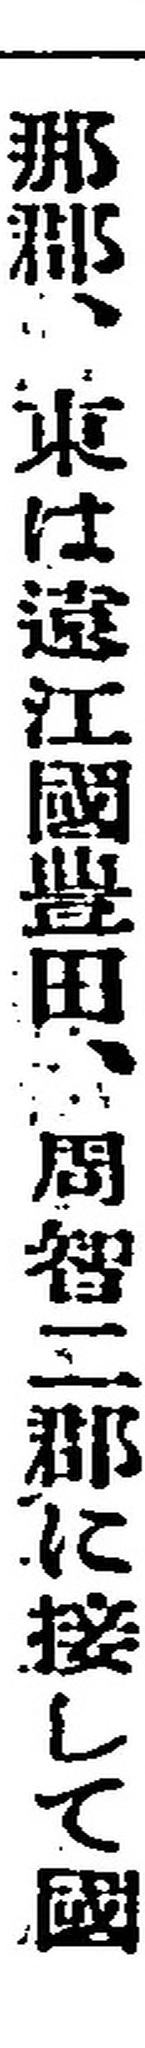那郡、東は遠江国豊田、周智二郡に接して国
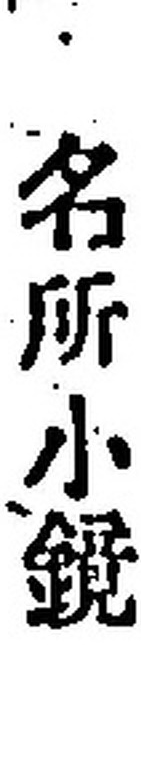名所小鏡
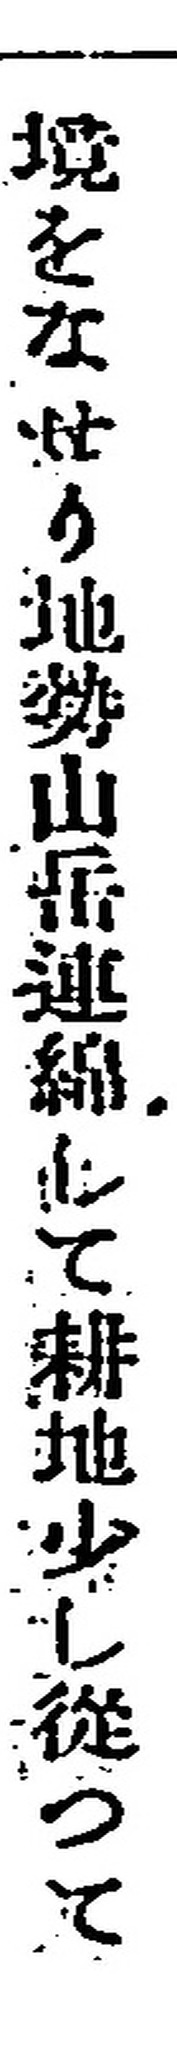境をなせり地勢山岳連綿して耕地少し従つて
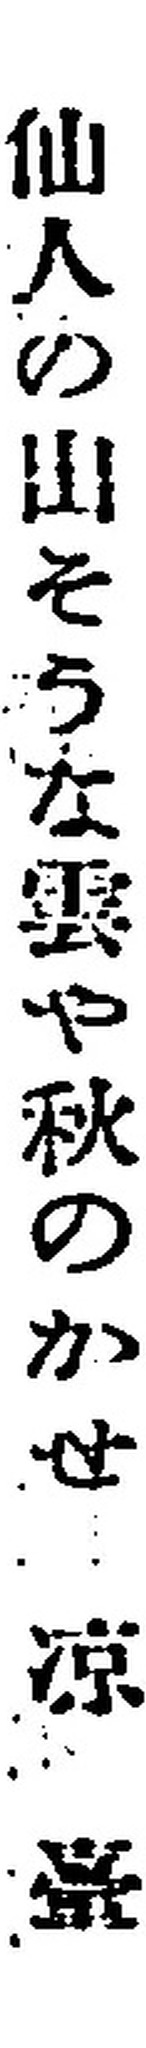仙人の出そうな雲や秋のかせ涼台
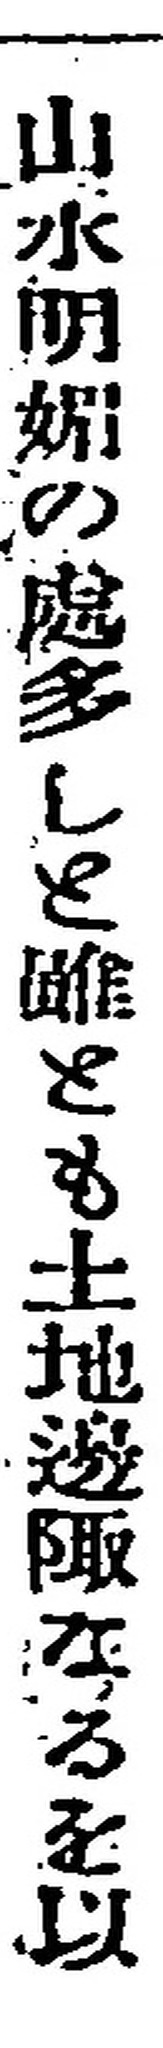山水明媚の処多しと雖とも土地辺陬なるを以
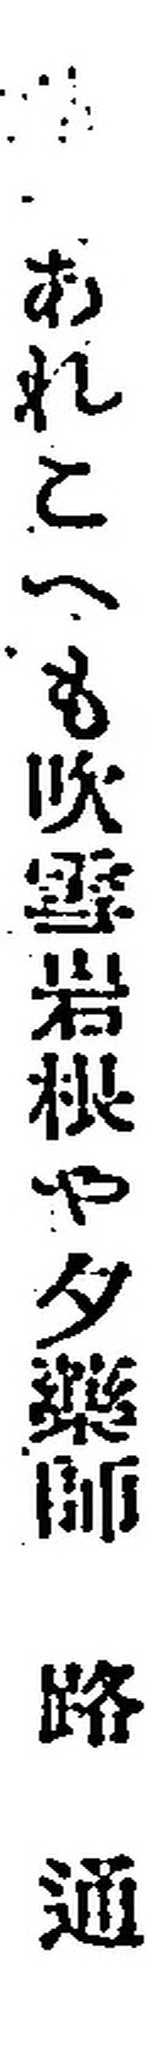あれこへも吹雪岩根や夕薬師路通
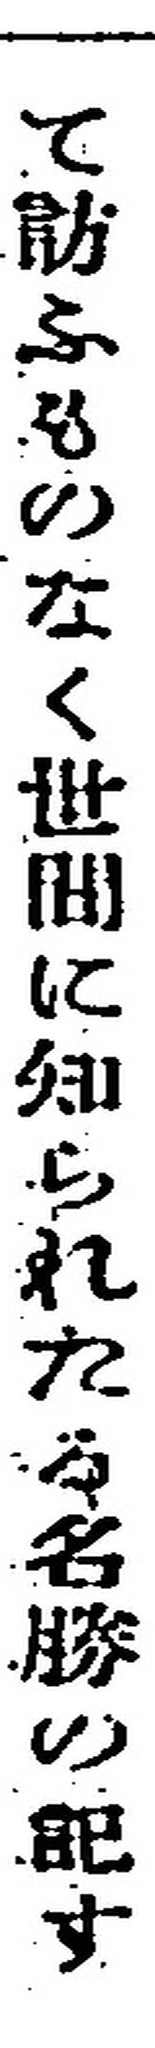て訪ふものなく世間に知られたる名勝の記す
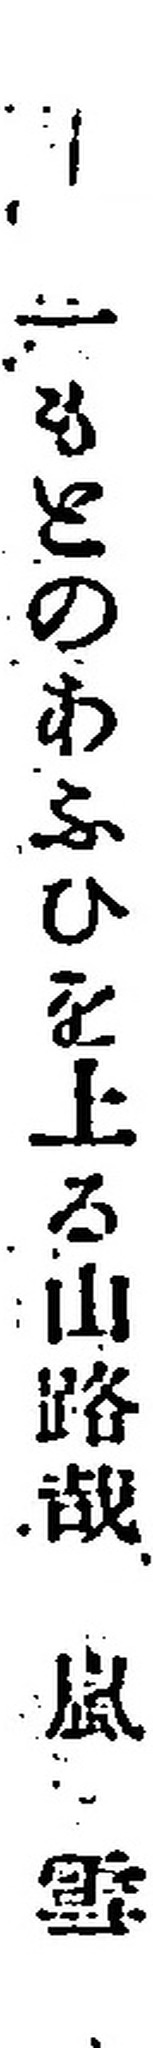一もとのあふひを上る山路哉嵐雪
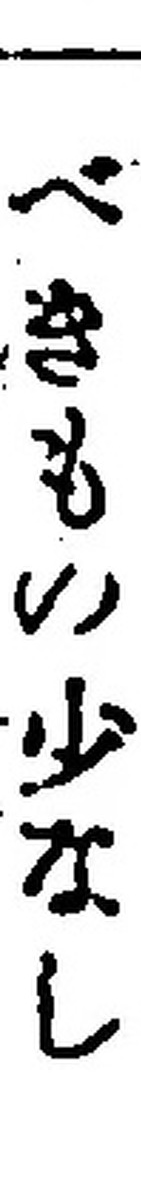べきもの少なし
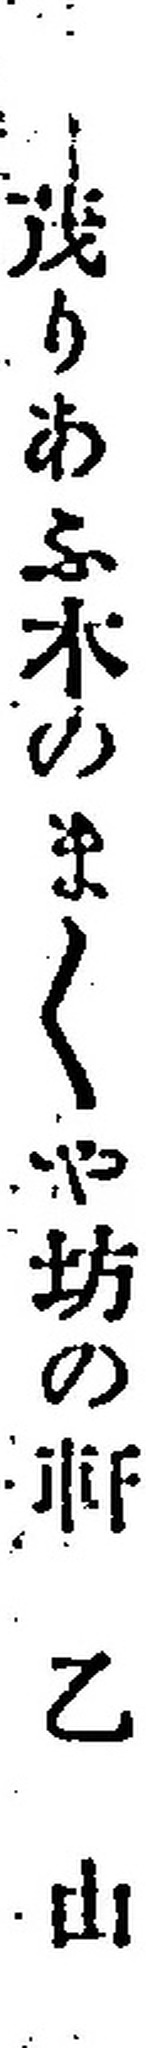茂りあふ木のま〳〵や坊の軒乙由
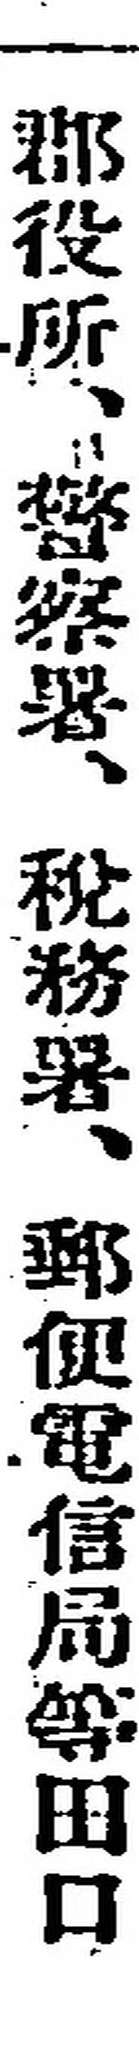郡役所、警察署、税務署、郵便電信局等田口
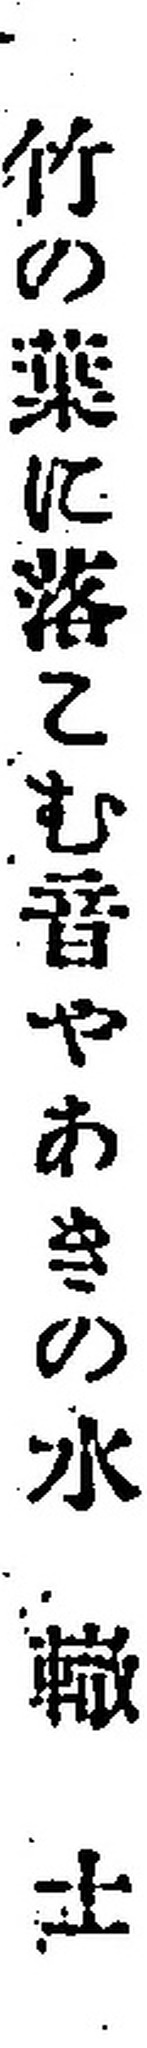竹の葉に落こむ音やあきの水轍士
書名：東参名勝案内
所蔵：国立国会図書館 National Diet Library, JAPAN
